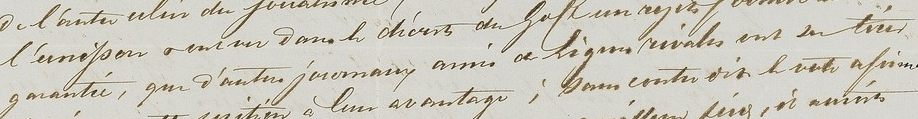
garantie, que d'autres journaux amis des Lignes rivales ont su tirer
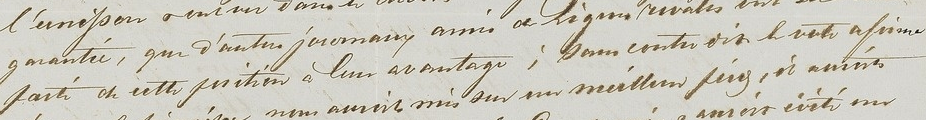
parti de cette position à leur avantage; sans contre dit le vote afirma-
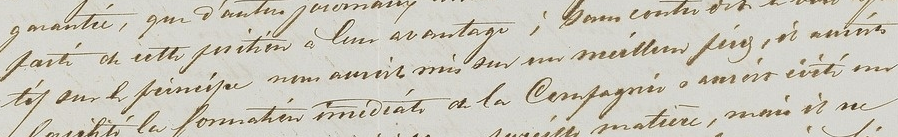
tif sur le principe nous aurait mis sur un meilleur prix, il aurait
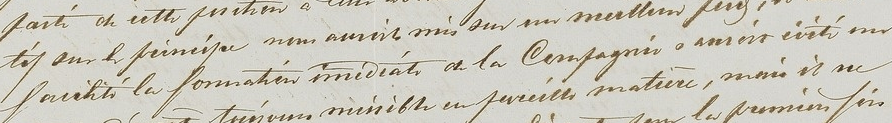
facilité la formation immédiate de la Compagnie & aurait évité un
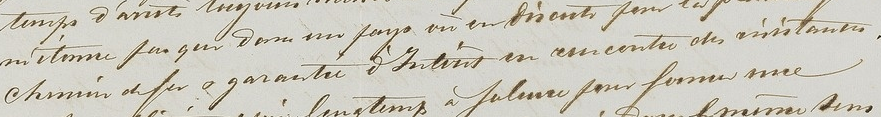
chemin de fer & garantie d'Intéret on rencontre des résistances.
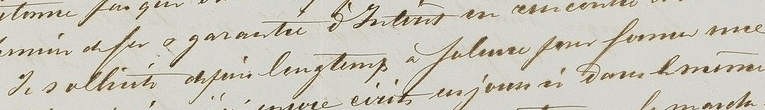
Je sollicite depuis longtemps à Soleure pour former une
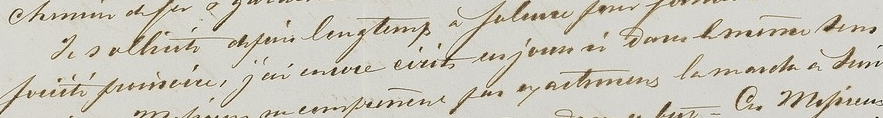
société provisoire, j'ai encore écrit en jours ci dans le même sens
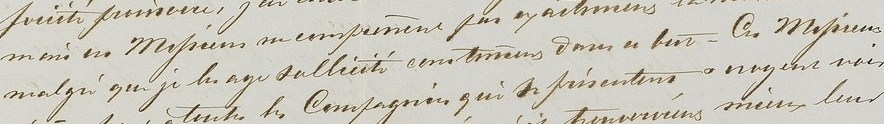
malgré que je les aye sollicité constamment dans ce but. Ces Messieurs
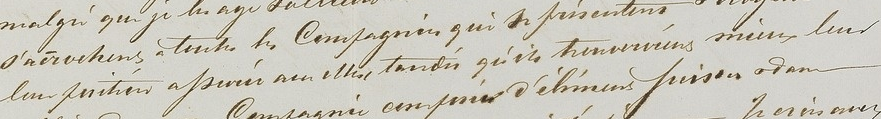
leur position assurée avec elles, tandis qu'il trouveriont mieux leur
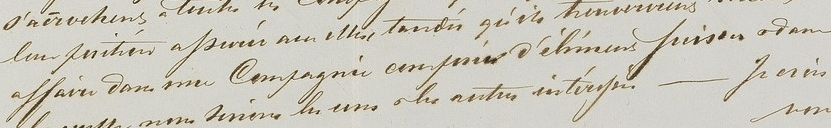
affaire dans une Compagnie composée d'éléments suisses & dans
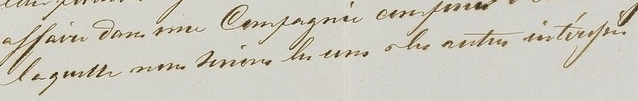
laquelle nous serions les uns & les autres intéressés. –
